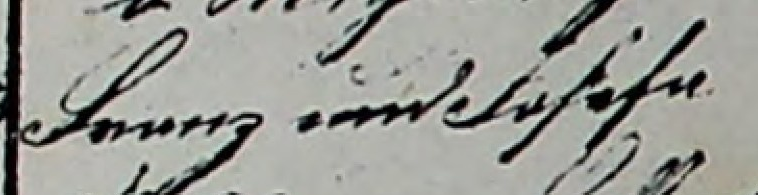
Franz und Josefa
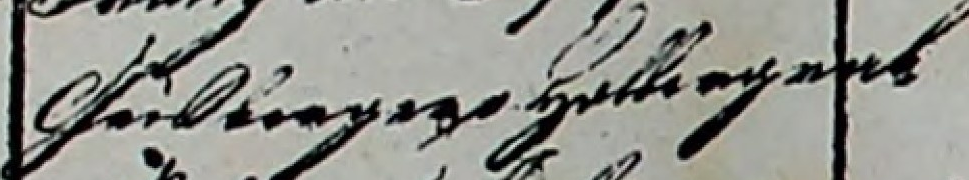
Gorsberger v. Hollergrab
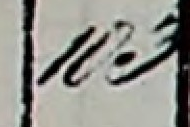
103
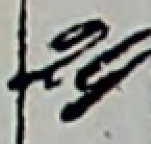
29
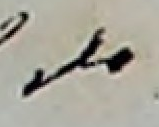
do
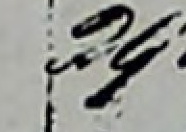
29
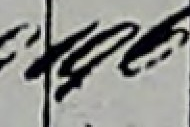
196
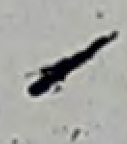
1
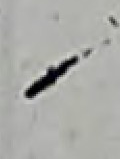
1
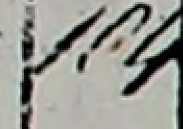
104
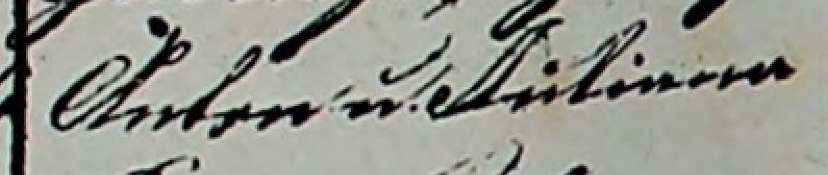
Anton u. Juliana
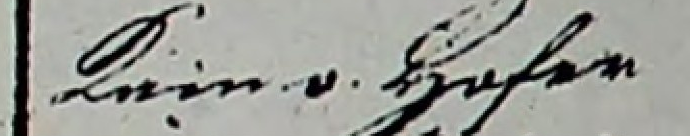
Kain v. Hofer
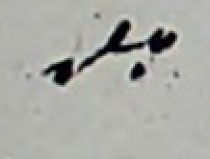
do
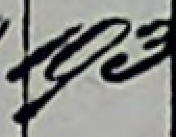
193
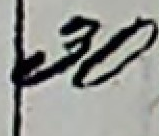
30
